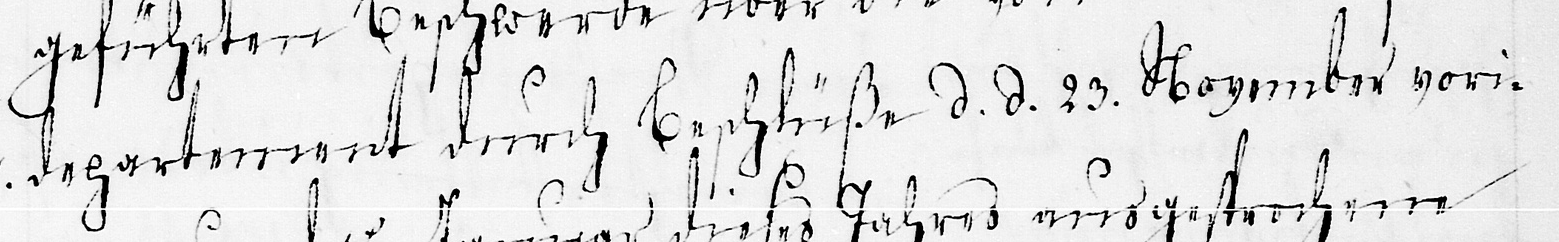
departement durch Beschlüße d. d. 23. November vori¬
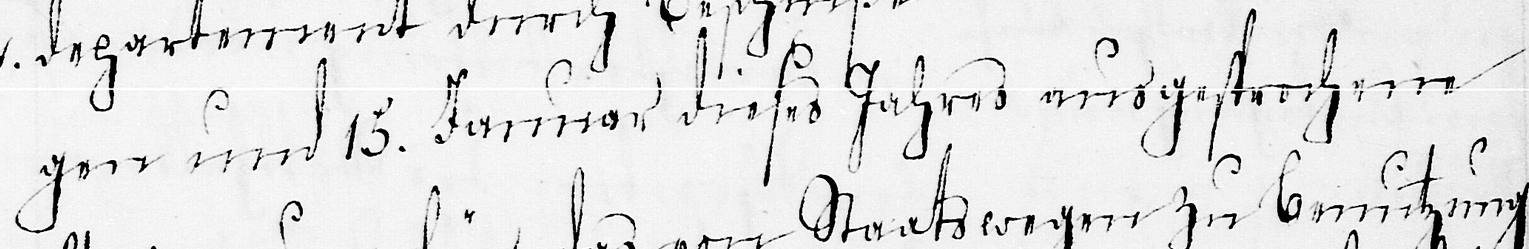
gen und 15. Januar dieses Jahres ausgesprochene
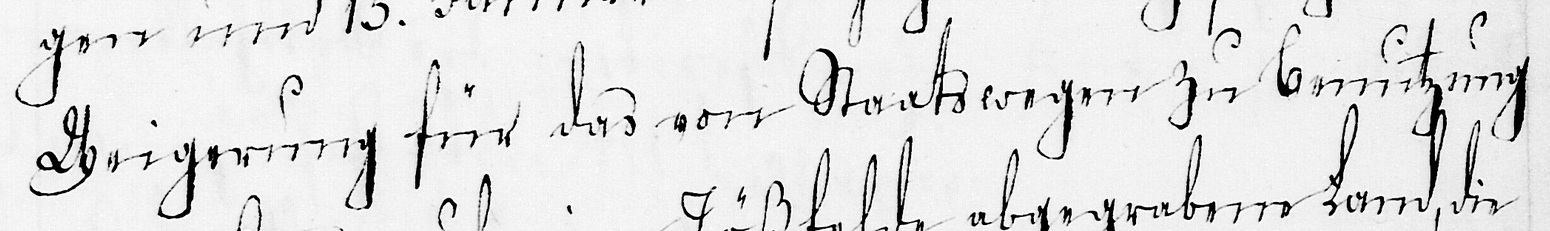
Weigerung für das von Staatswegen zu Benutzung
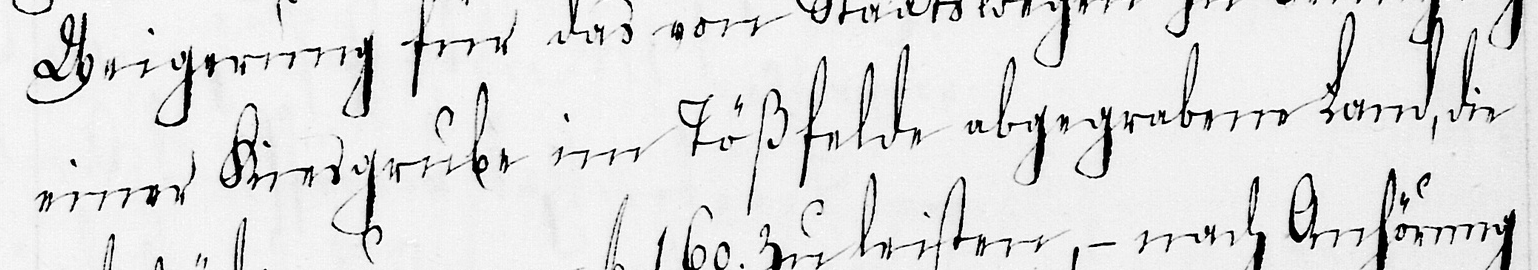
einer Kiesgrube im Tößfelde abgegrabene Land, die
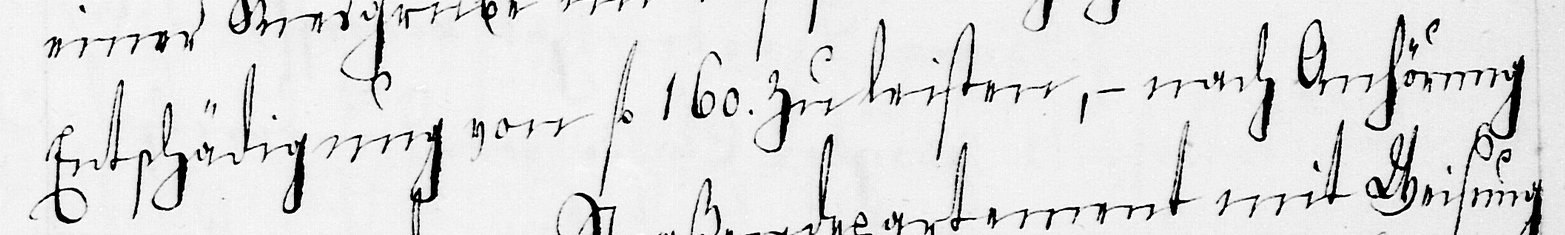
Entschädigung von fl. 160. zu leisten, – nach Anhörung
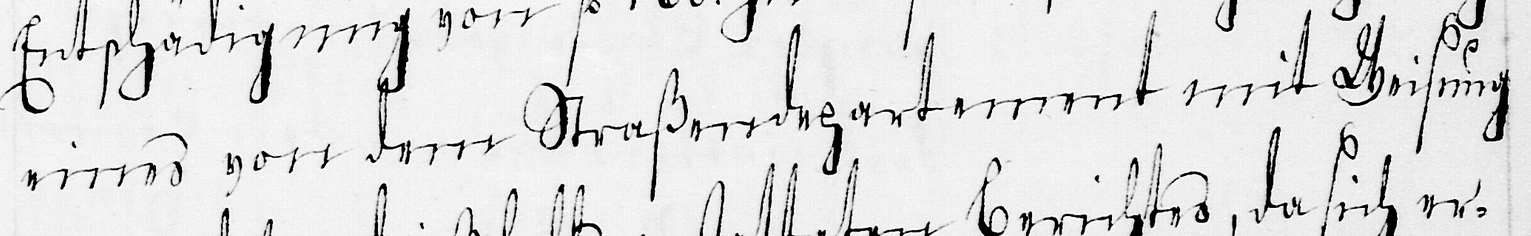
eines von dem Straßendepartement mit Weisung
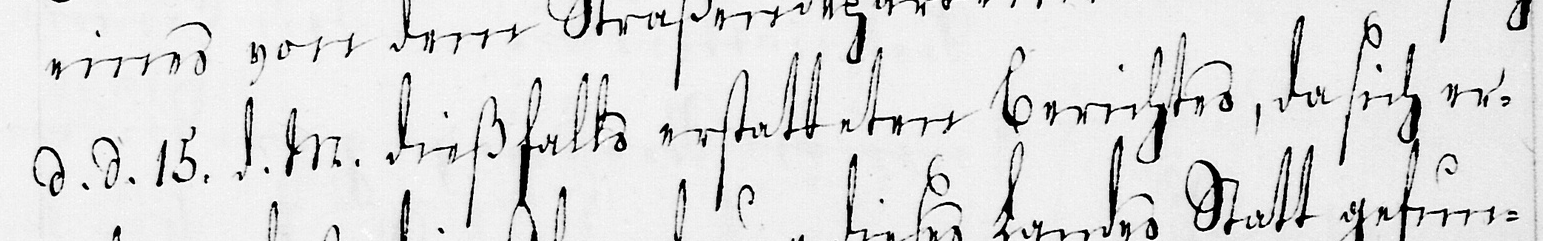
d. d. 15. d. M. dießfalls erstatteten Berichtes, da sich er¬
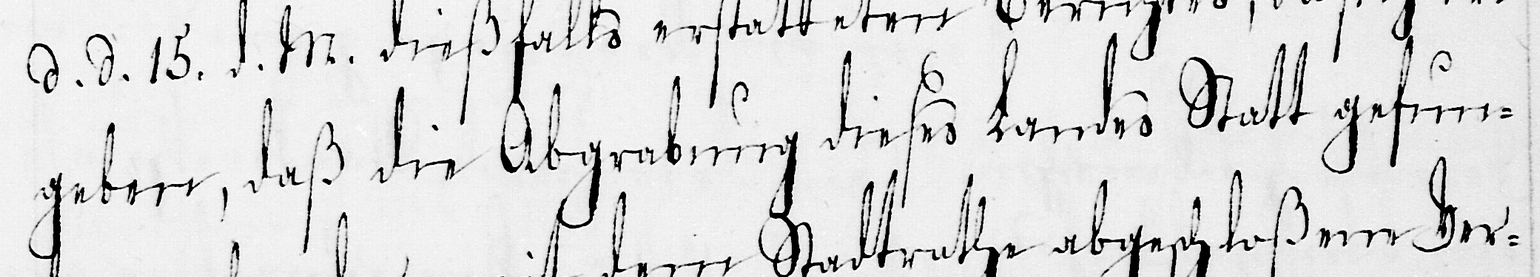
geben, daß die Abgrabung dieses Landes Statt gefun¬
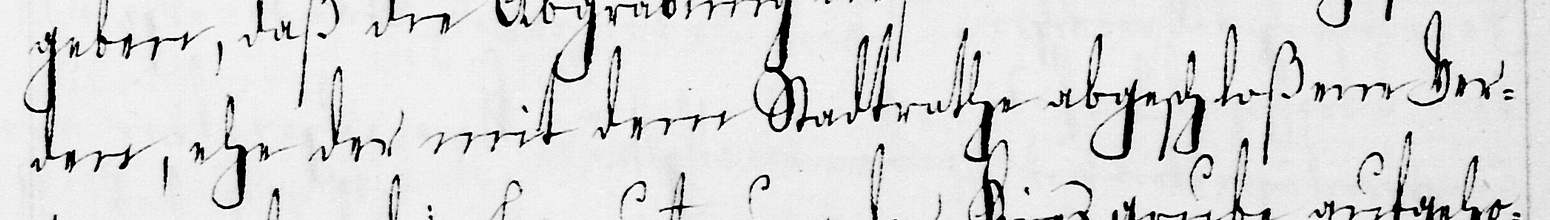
den, ehe der mit dem Stadtrathe abgeschloßene Ver¬
